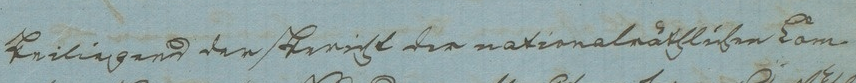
Beiliegend der Bericht der nationalräthlichen Com-
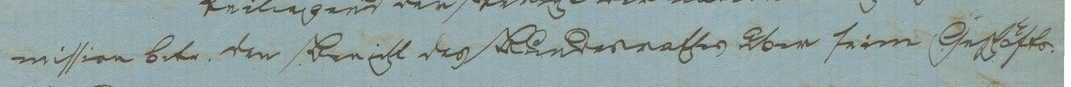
mission betr. den Bericht des Bundesrathes über seine Geschäfts-
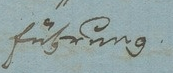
führung.
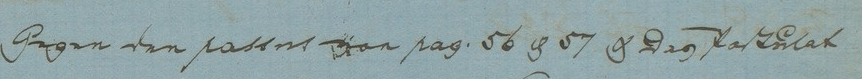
Gegen den passus von pag. 56 & 57 & das Postulat
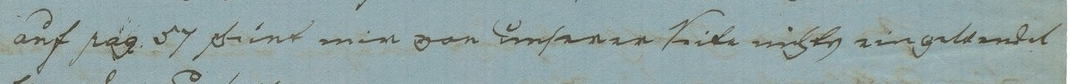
auf pag. 57 scheint mir von unserer Seite nichts eingewendet
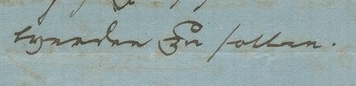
werden zu sollen.
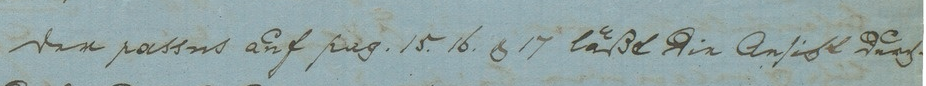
Der passus auf pag. 15. 16. & 17 läßt die Ansicht durch-
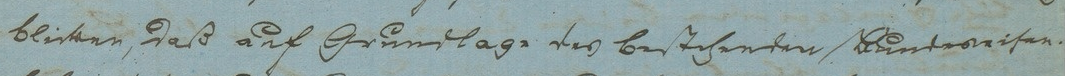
blicken, daß auf Grundlage des bestehenden Bundeseisen-
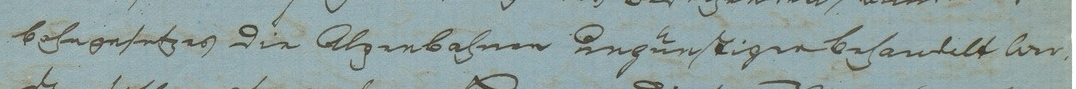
bahngesetzes die Alpenbahnen ungünstiger behandelt wer-
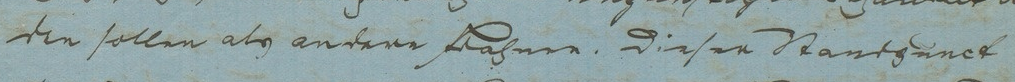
den sollen als andere Bahnen. Dieser Standpunct
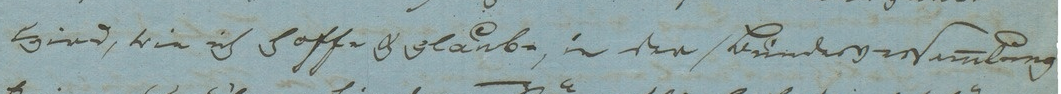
wird, wie ich hoffe & glaube, in der Bundesversammlung
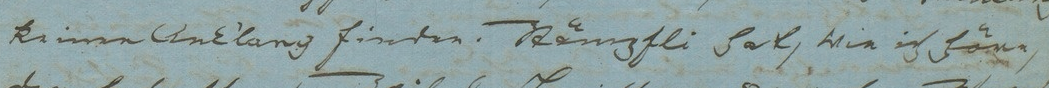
keinen Anklang finden. Stämpfli hat, wie ich höre,
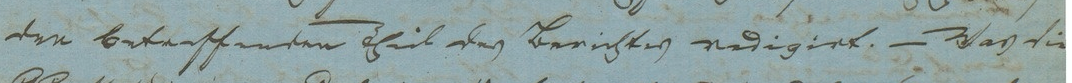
den betreffenden Theil des Berichtes redigirt. – Was die
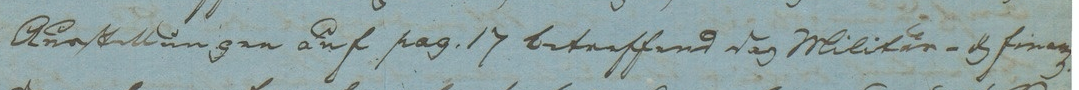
Ausstellungen auf pag. 17 betreffend das Militär- & Finanz -
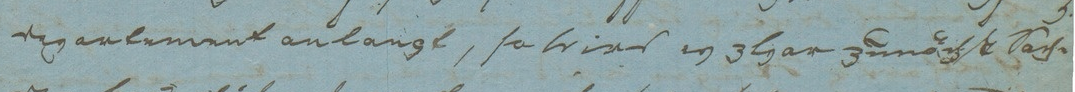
departement anlangt, so wird es zwar zunächst Sache
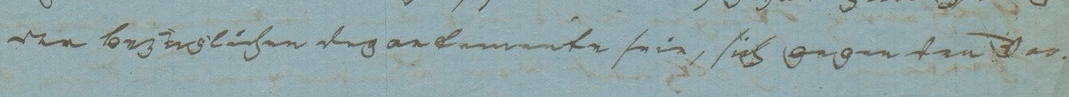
der bezüglichen Departemente sein, sich den Vor-
